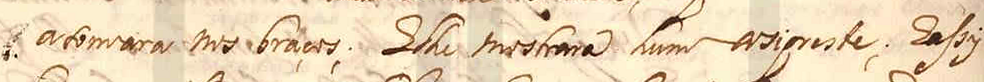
a tomara nos braços, E lhe mostrara hum asipreste, E assy
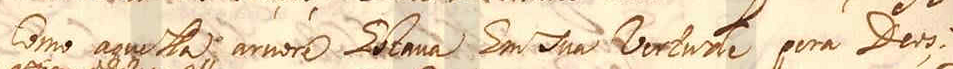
Como aquella aruore Estaua Em sua Vertude pera Deos;
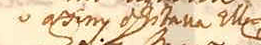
asim o Estaua Ella
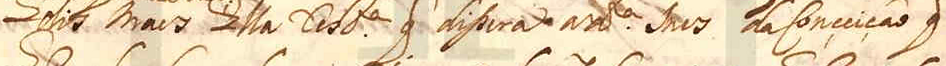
E dis maes Ella test.a q̄ dissera a d.a Ines da Conceiçaõ q̄
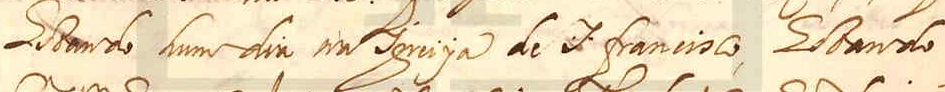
Estando hum dia na Igreiya de S. Francisco, Estando
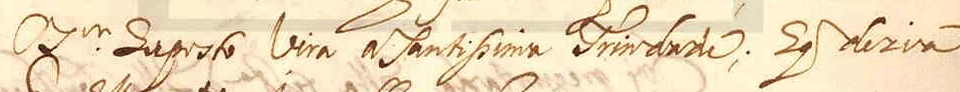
O S.or Exposto Vira a Santissima Trindade, E q̄ dezia
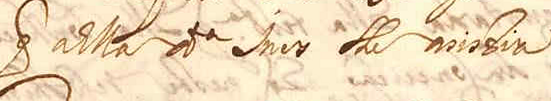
q̄ a Ella d.a Ines lhe asistia
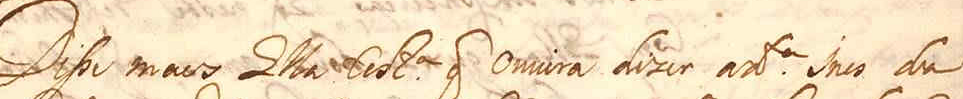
Disse maes Ella test.a q̄ ouuira dizer a d.a Ines da
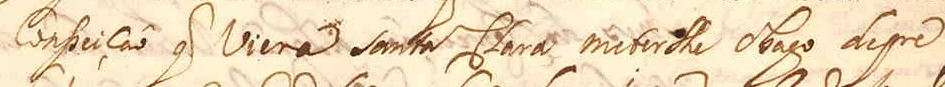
Consseiçaõ q̄ Viera santa Clara meter lhe o bago de pre
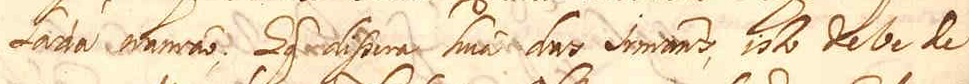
Lada na maõ, E q̄ dissera huā das Irmans, isto deve de
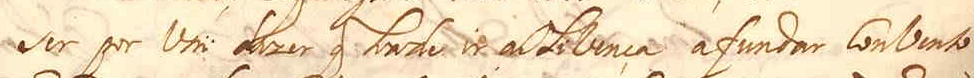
ser por Vm. dizer q̄ ha de ir a OLivença a fundar Convento
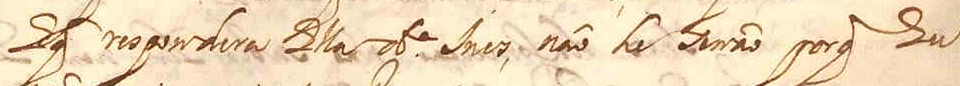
E q̄ respondera Ella d̄.a Ines naõ he senão porq̄ Eu
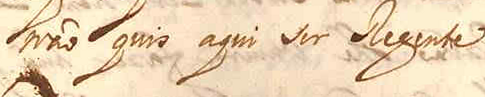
naõ quis aqui ser Regente
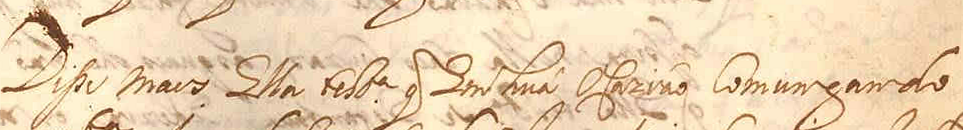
Disse maes Ella test.a q̄ Em huā OCazião Comungando
